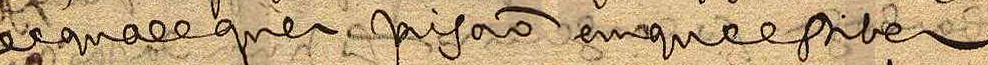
de quallquer prisaõ em que estiver
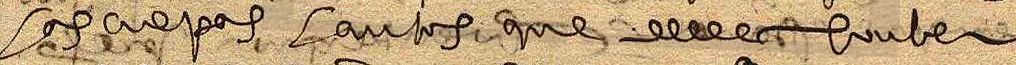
E as culpas E autos que delle houver
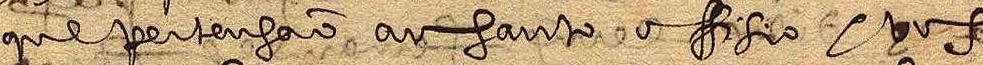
que pertensaõ ao santo offisio E vos
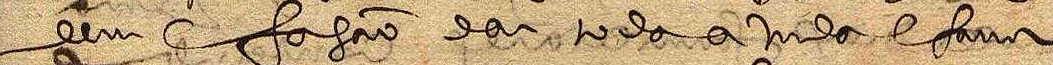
dem e fasaõ dar toda aIuda e fauor
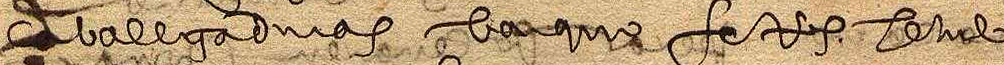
cavallgaduras barquo feRos he tudo
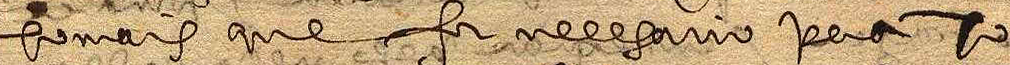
ho mais que for necesario pera ho
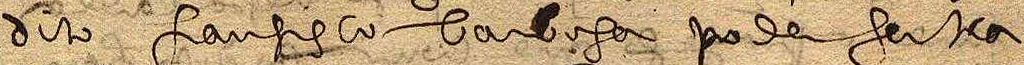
dito fransisco barbosa poder ser tra
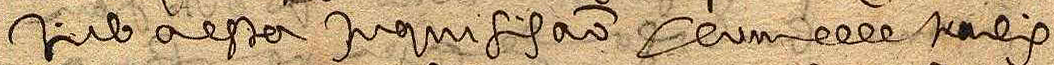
zido a esta Jnquisisaõ E com elle trareis
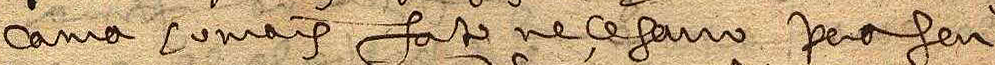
cama E o mais fato neçesario pera seu
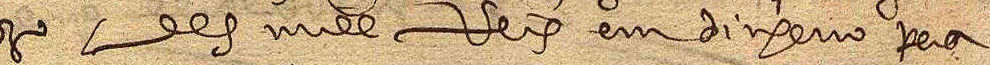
vzo E des mill Reis em dinheiro pera
